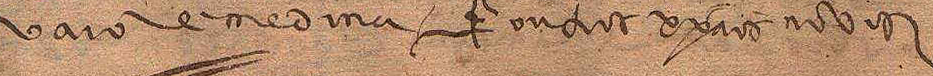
varo de medina / ꝑ outros xpãos novos
